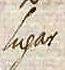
lugar
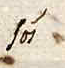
sós
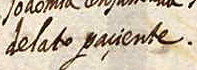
delato paciente.
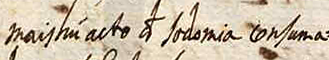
mais hū acto d̄ sodomia consuma
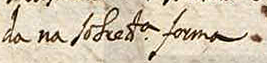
da na sobred̄.a forma.
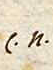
c. n.
